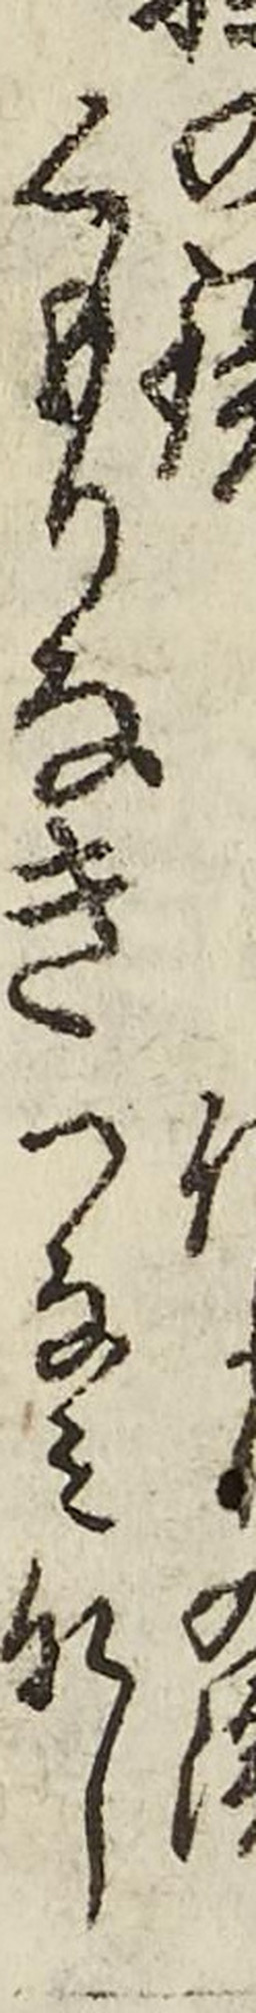くもりなきつなみなし
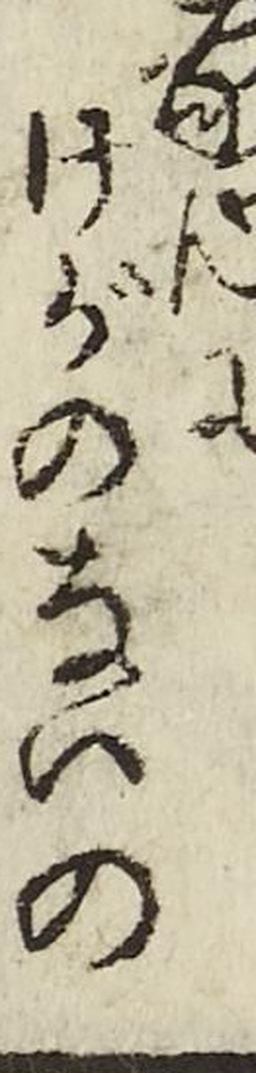けがのない

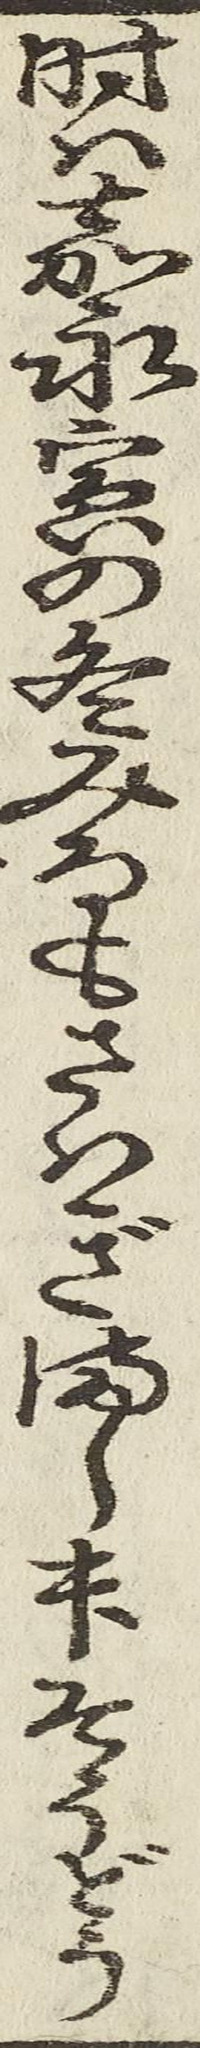時は嘉永寅の冬みるもさはぎまし升そうどう
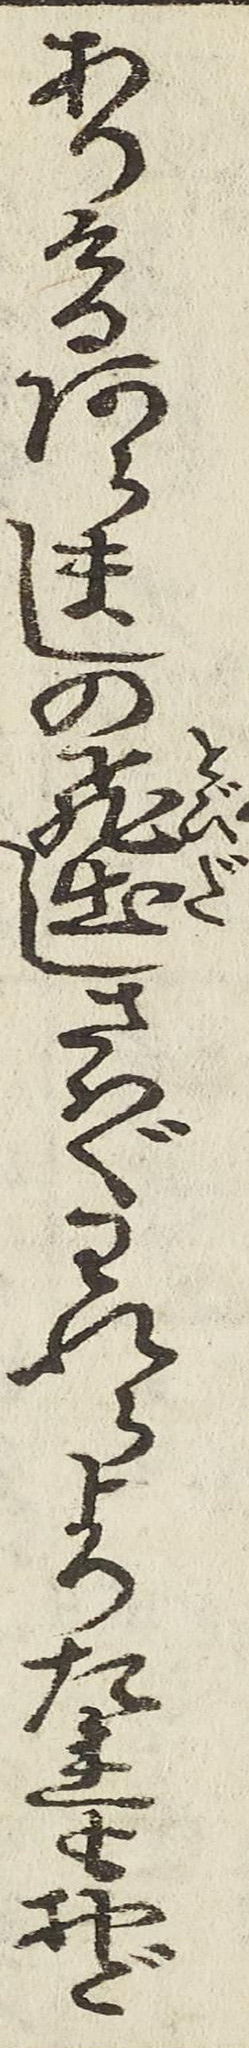ありけるあらましの飛出しさはぐわれらよりたれもおど
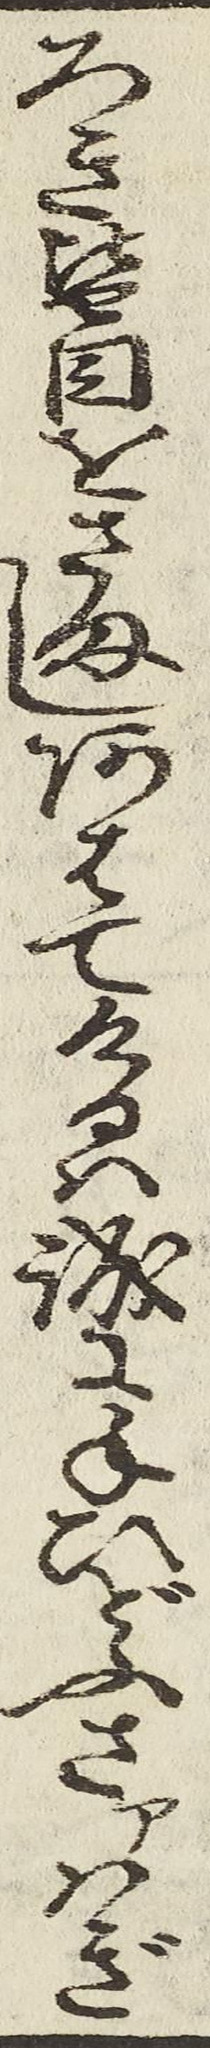ろき皆目をさましあはてけるは誠に手ひどふさアはぎ
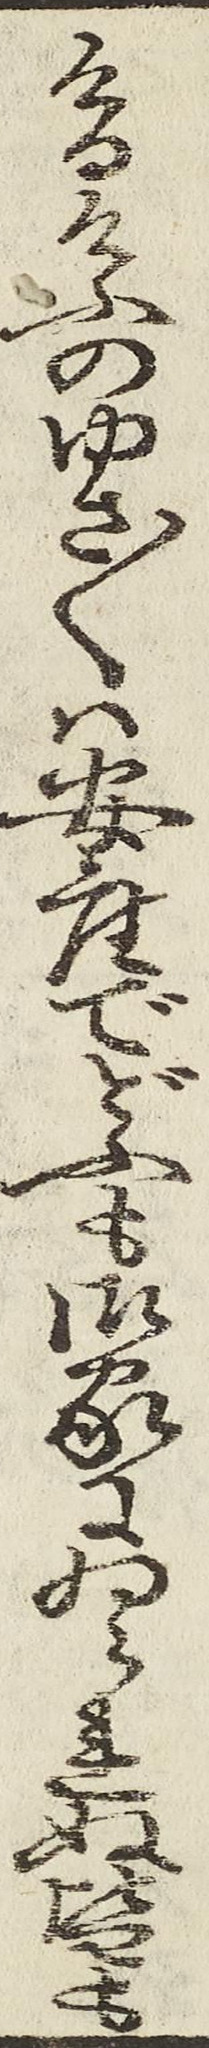けるけふのゆさ〳〵は安産でどふも御家にゐられぬ皆も
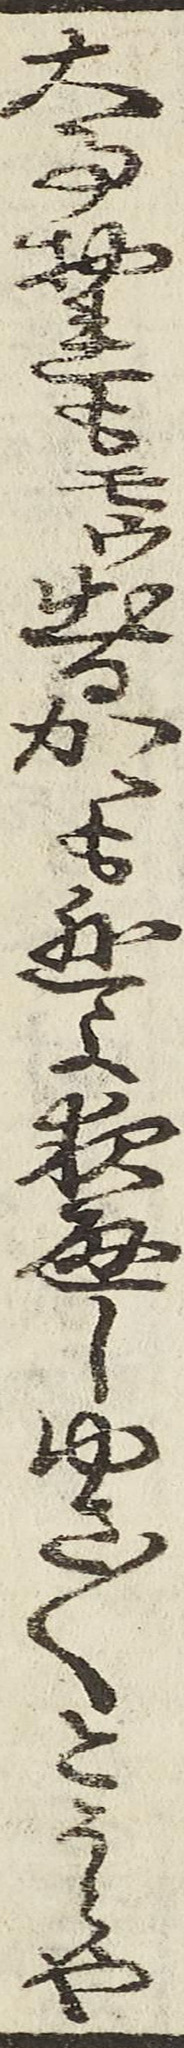大事おれもモウ出るかゝも逃よ夜通しゆさ〳〵とうらや
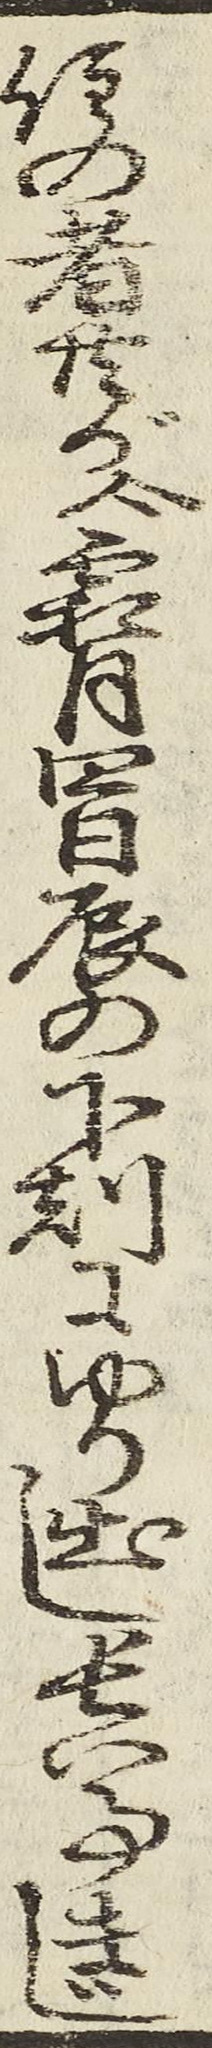住の者だが、霜月四日辰の下刻にゆり出し長い事まじ
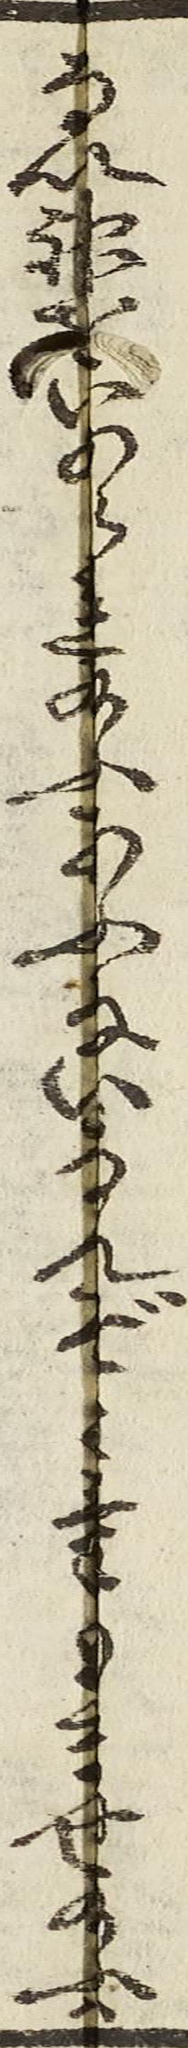ない神をいのられ給ふあふないなんぞと気もませ給ふは
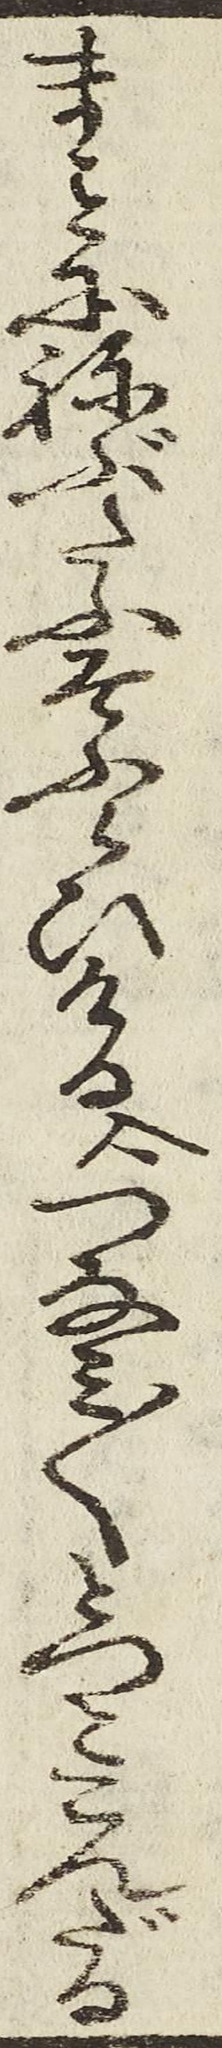まことにねぶたふそうらひける、つなみ〳〵とつとこんだる
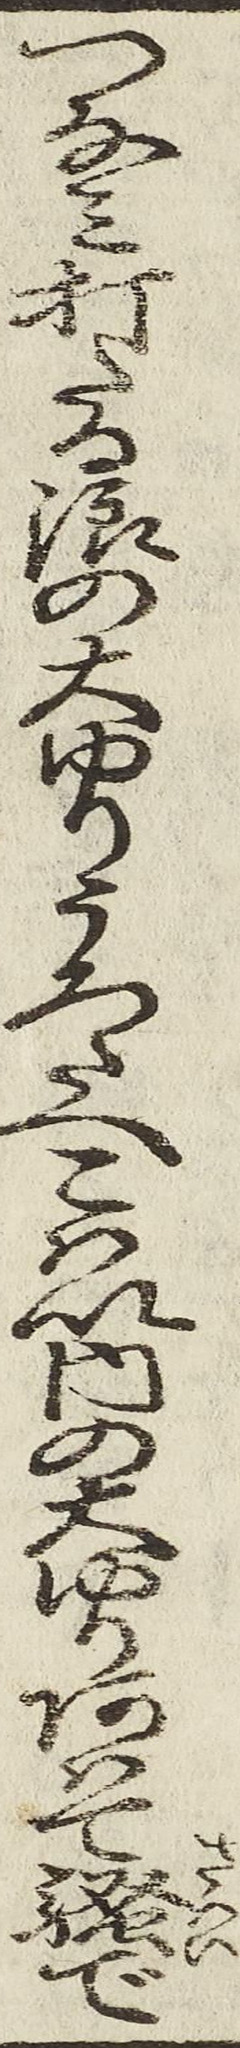つなみ打たる浪の大ゆりうろたへこはい内の大ゆりあはて騒で
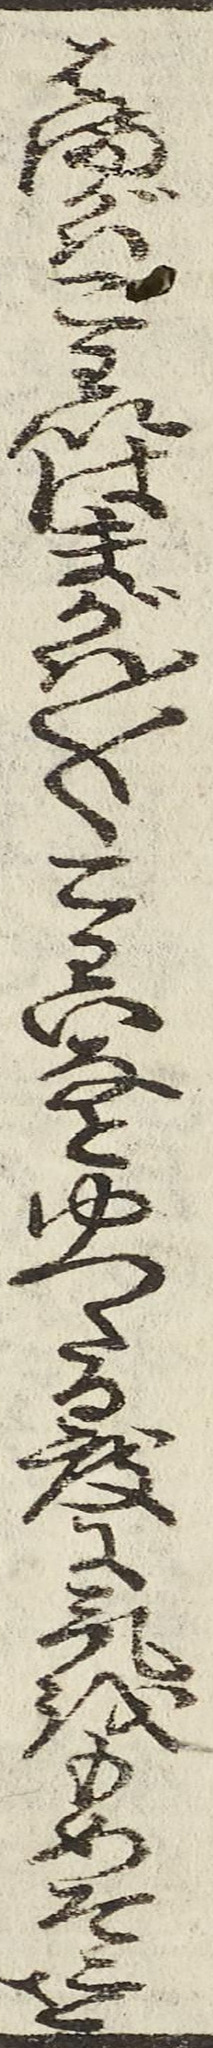はまがはこわいはまがは〳〵〳〵こわいなとゆつたる度に気をもめそこを
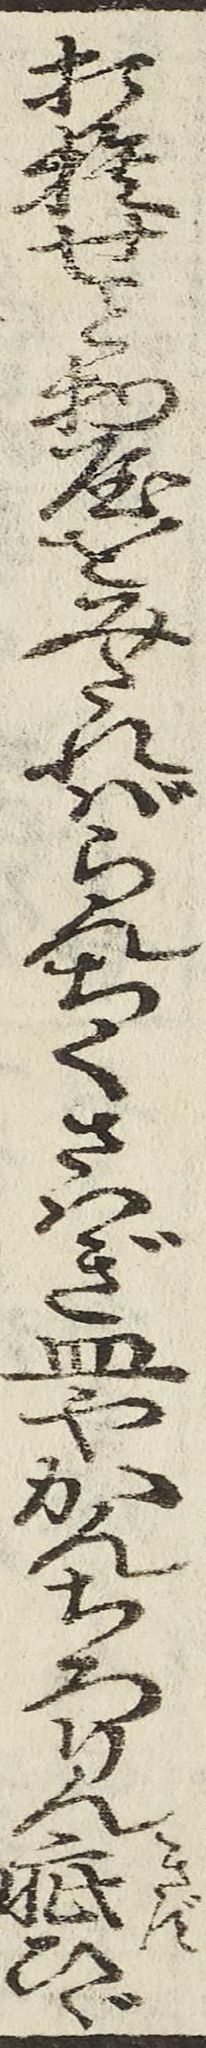打捨せと物屋をみたればらんちくさはぎ皿やかんちろりん疵ひゞ
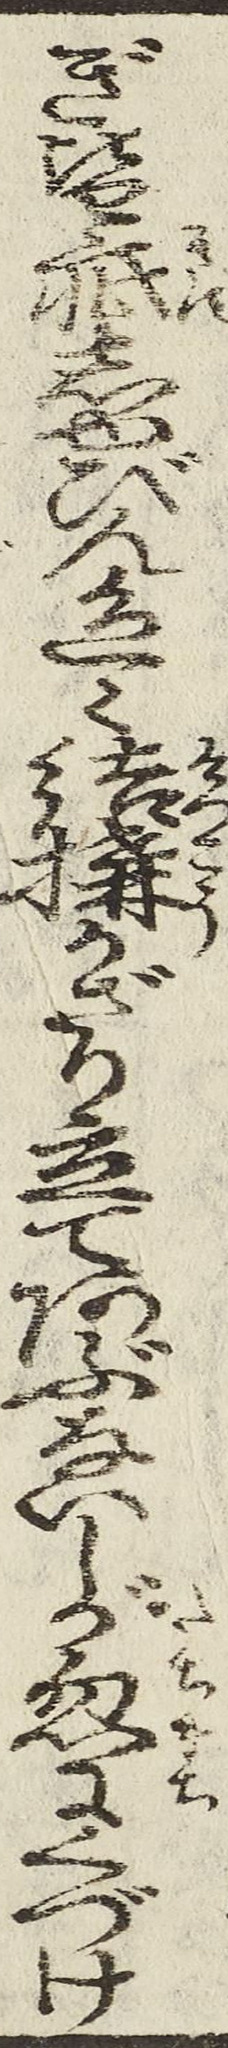ぎ皆疵しゆびん色々結構かざり立てあぶないしが忽にくづけ
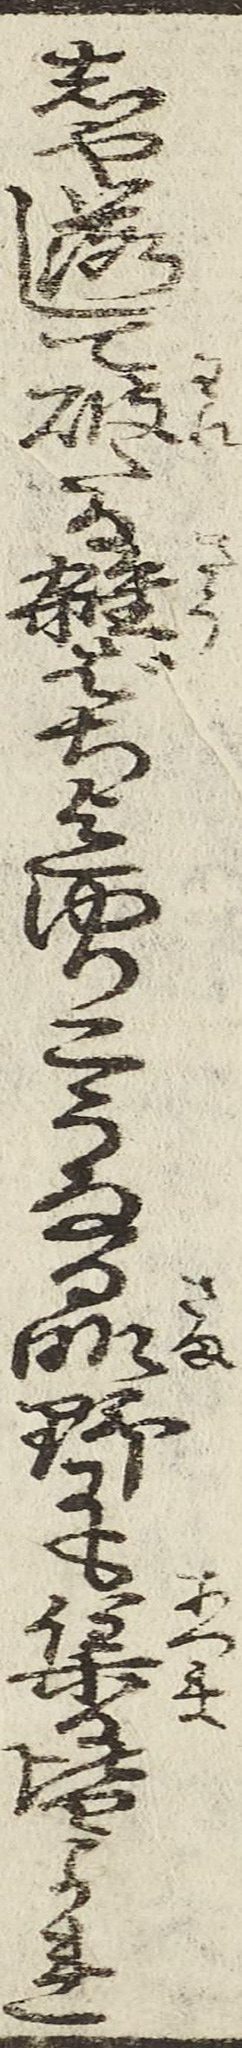しや落して破たる雑ばち迄ゆりこうなる様野にも集る皆よれ
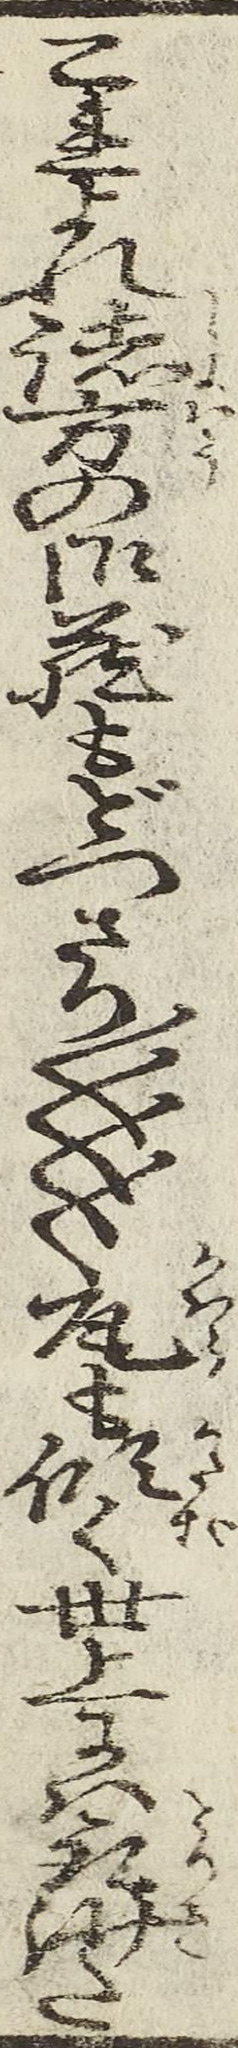これよれ諸方の御蔵もどつさり〳〵〳〵〳〵〳〵瓦も傾く世上には取沙た
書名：地震津浪末代噺の種　全
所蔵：東京大学地震研究所図書室 Earthquake Research Institute Library, The University of Tokyo, JAPAN
